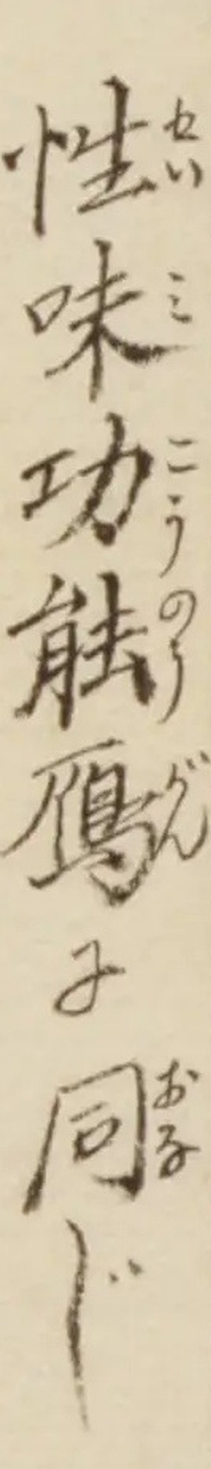性味功能鴈に同じ
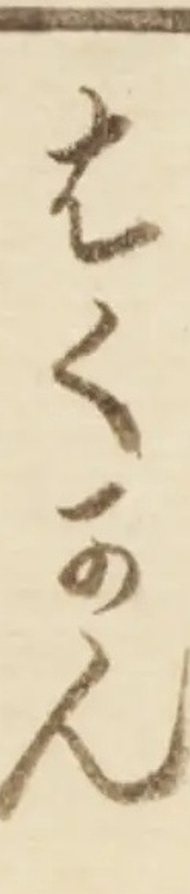はくかん

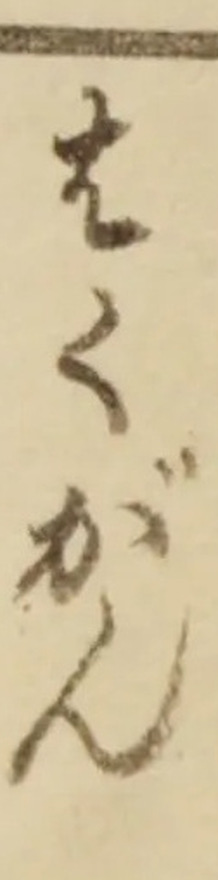はくがん
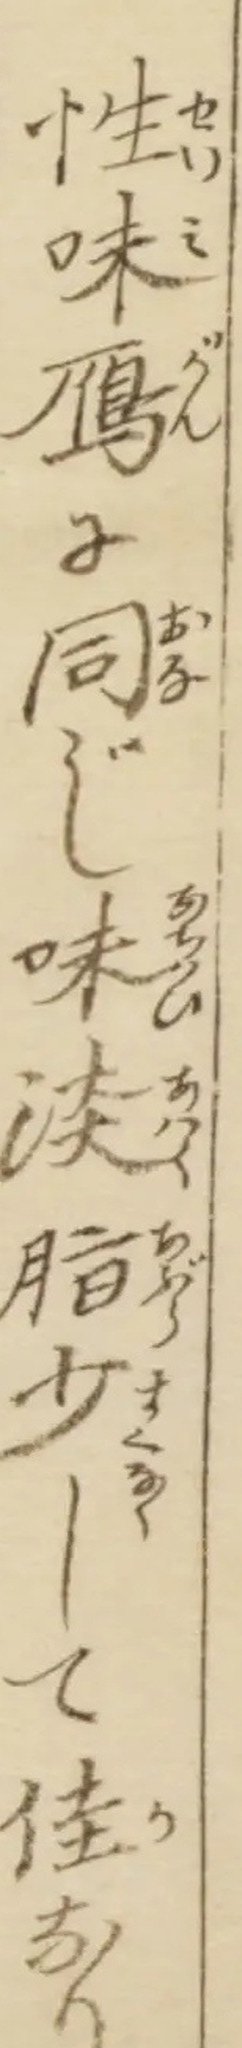性味鴈に同じ味淡脂少して佳なり
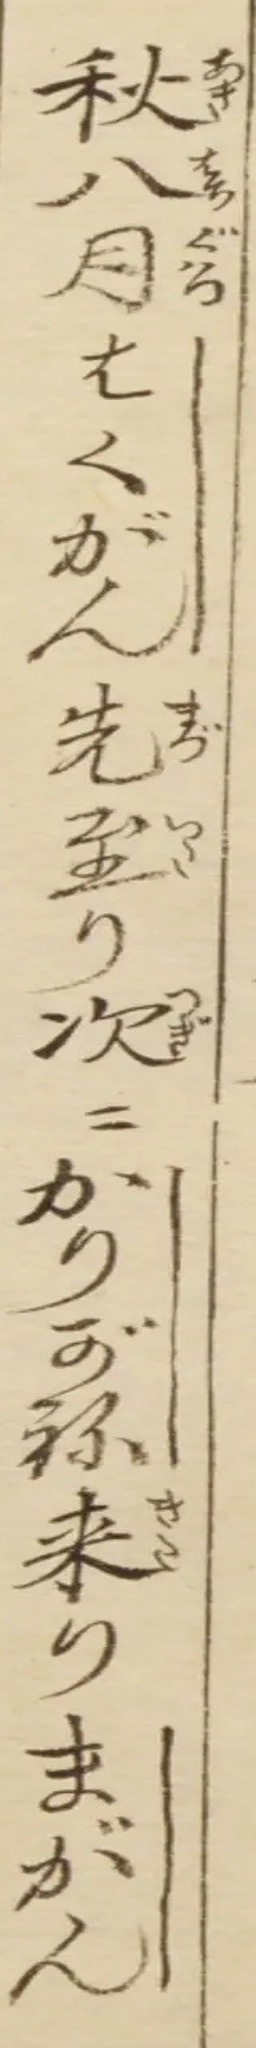秋八月はくがん先至り次にかりがね来りまがん
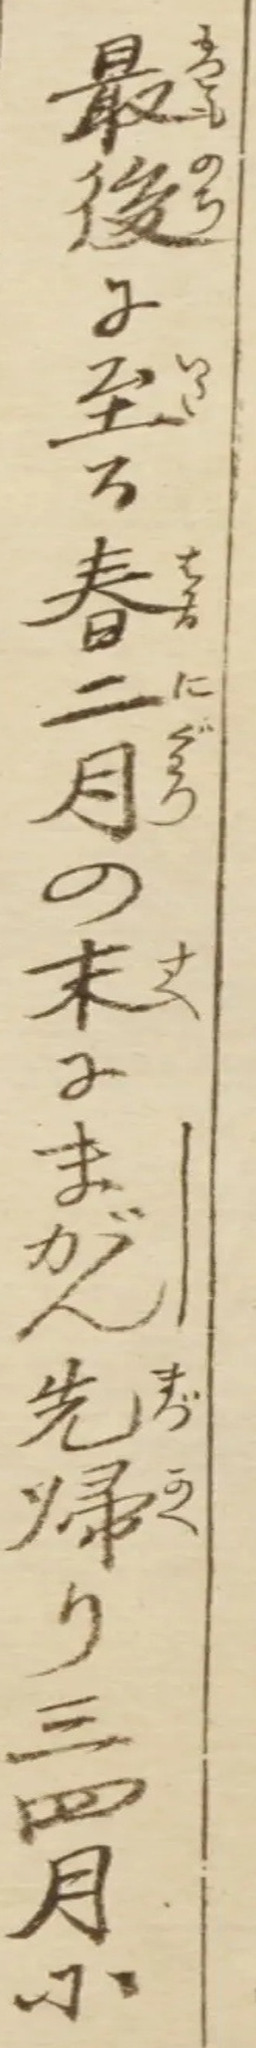最後に至る春二月の末にまがん先帰り三四月に
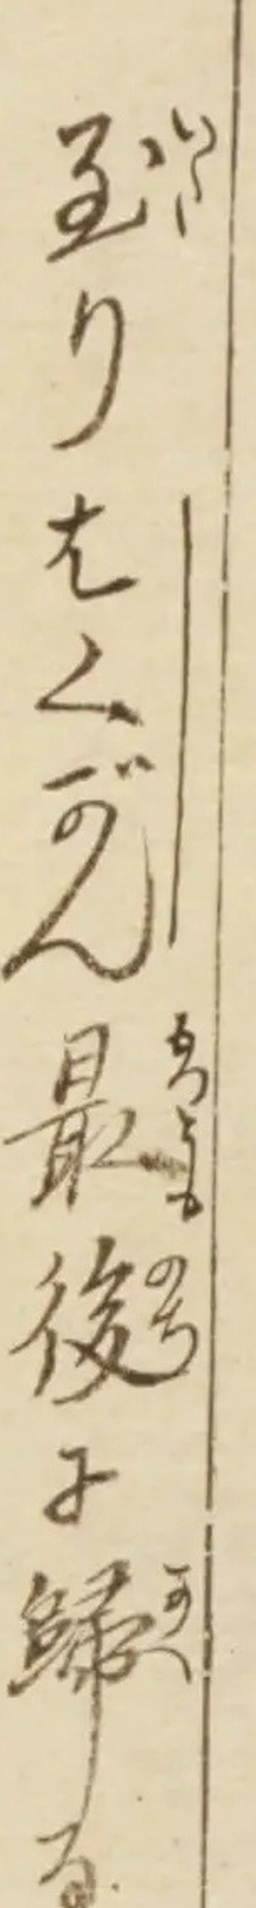至りはくがん最後に帰る
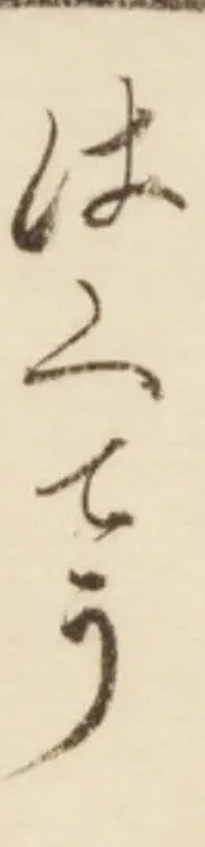はくてう

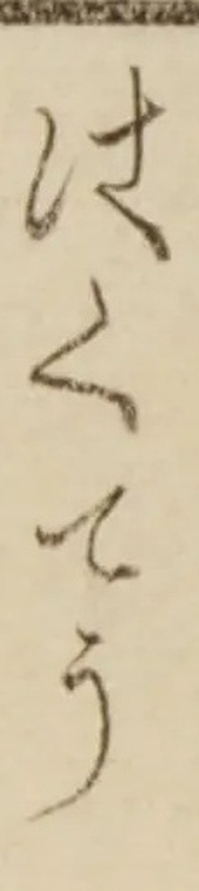はくてう
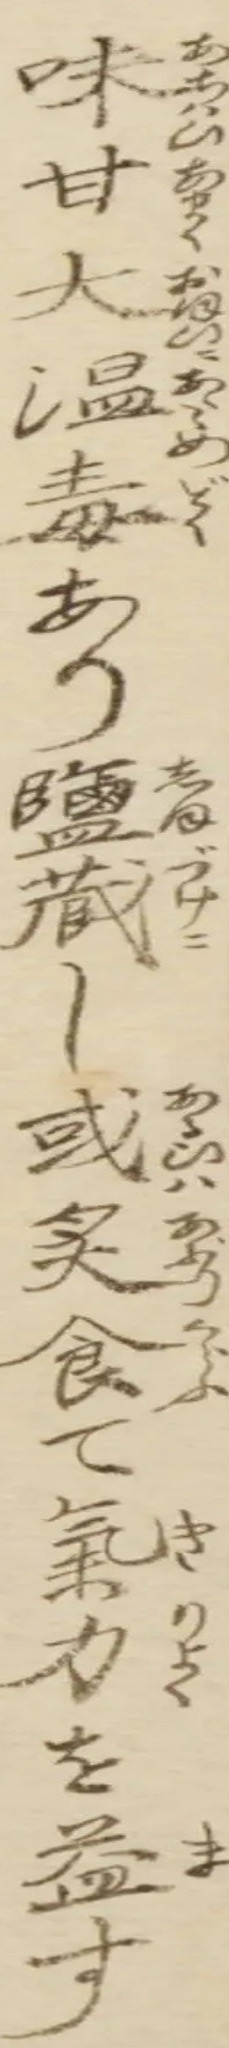味甘大温毒あり塩蔵し或炙食て気力を益す
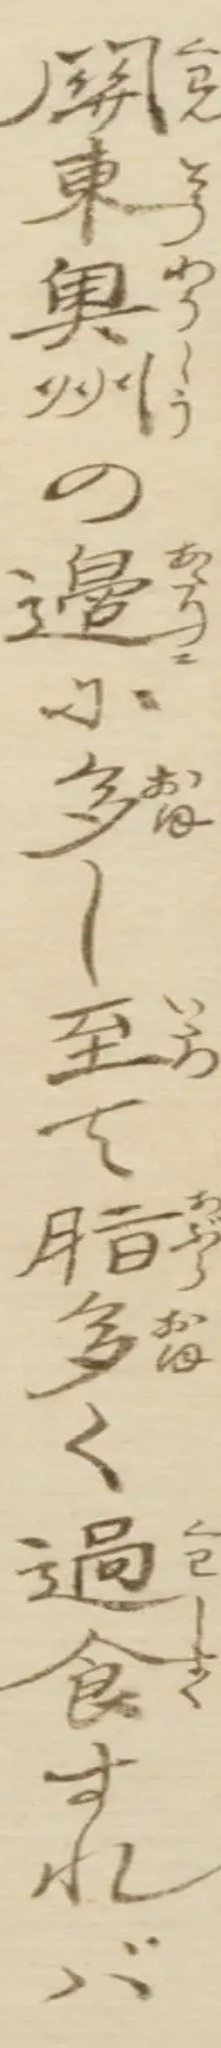関東奥州の辺に多し至て脂多く過食すれば
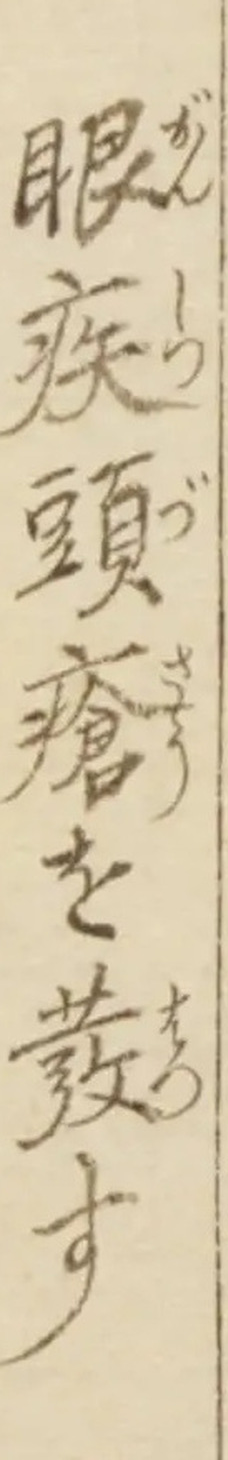眼疾頭瘡を発す
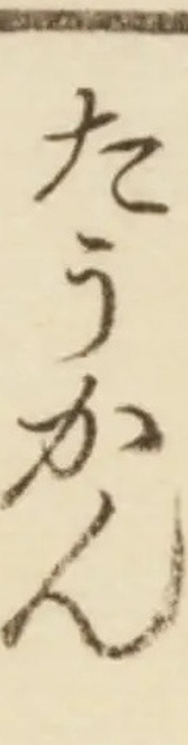たうかん

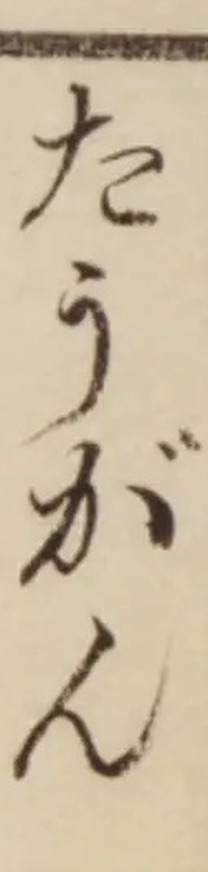たうがん
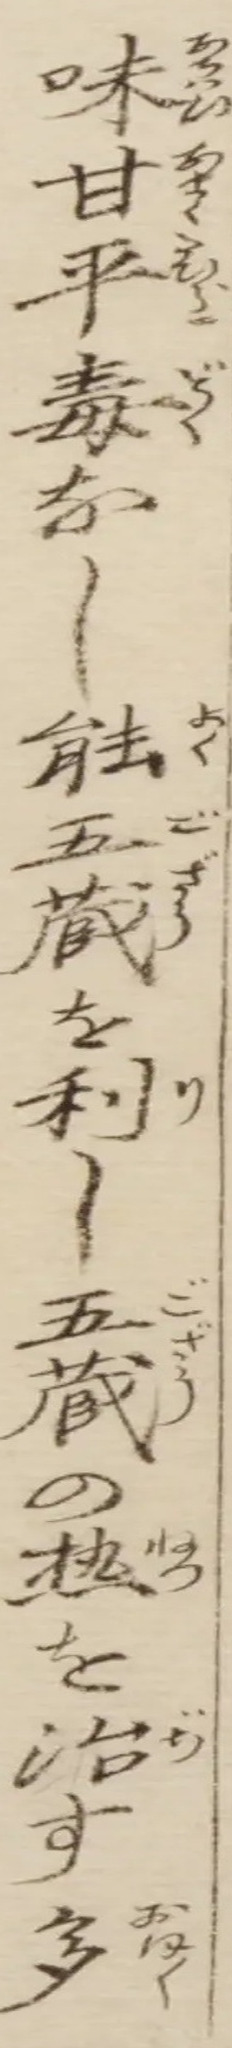味甘平毒なし能五蔵を利し五蔵の熱を治す多
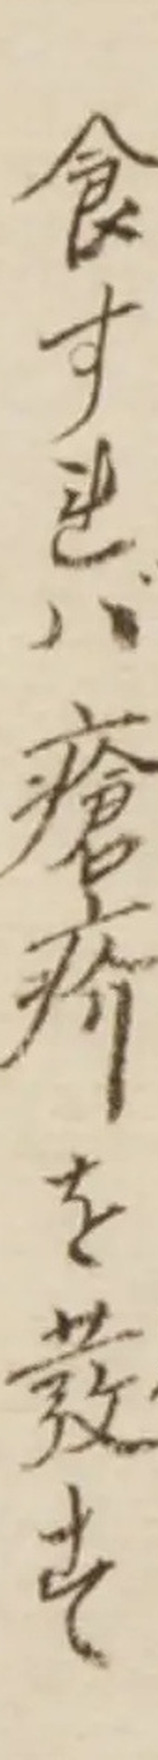食すれば瘡疥を発す
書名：華鳥譜
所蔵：国立国会図書館 National Diet Library, JAPAN
